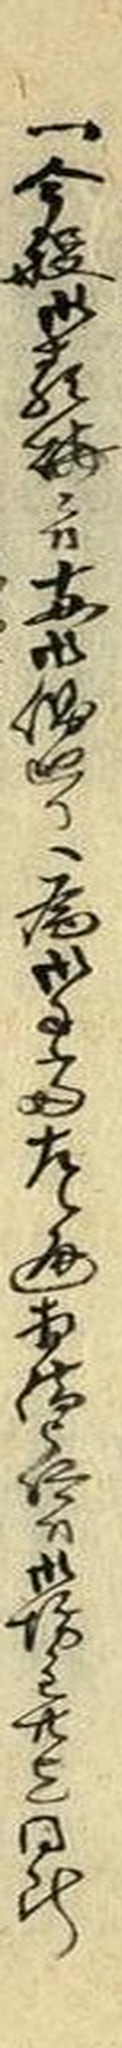一今般御類焼ニ付両御側廻りへ為御手当左之通拝借被仰付御坊主迄同断
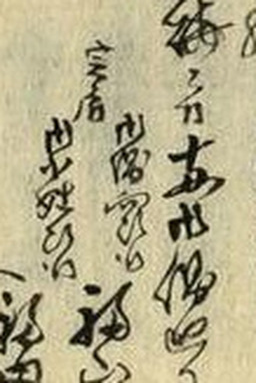御小姓頭取
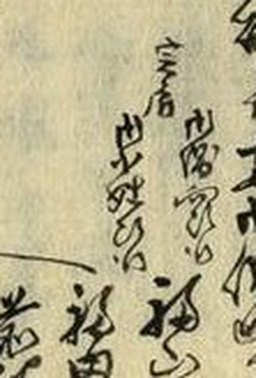御小姓頭取
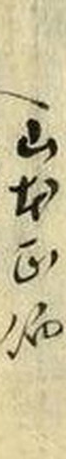山本正伯
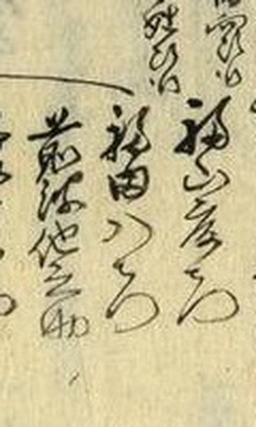福田八右衛門
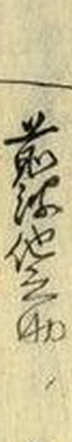前波他之助
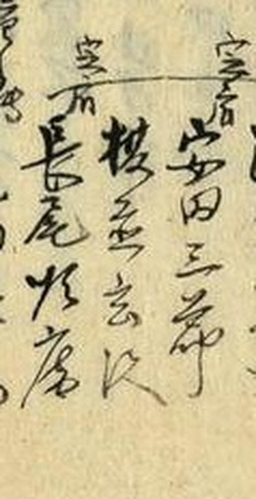榎並玄沢
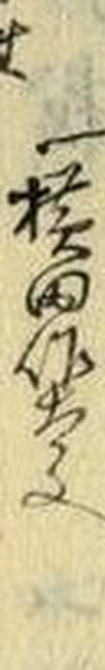横田作太夫
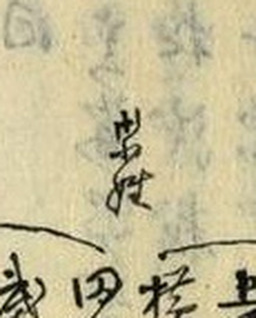御小姓
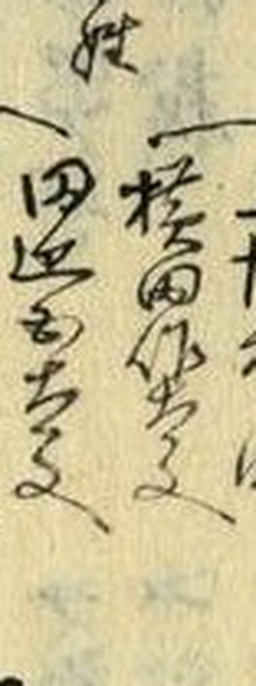田辺五太夫
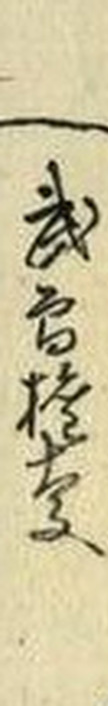武曾権太夫
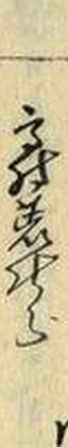高村荒次郎
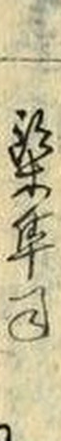鈴木隼司
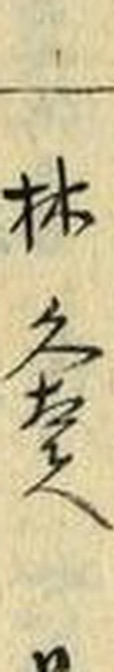林久太夫
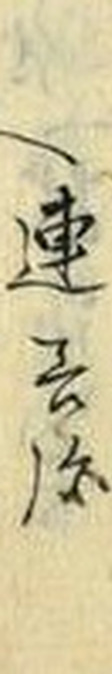連善弥
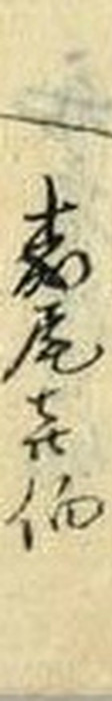森尾喜伯
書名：少傅日録抄（斉承付側向頭取日記、在府）
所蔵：福井県文書館 Fukui Prefectural Archives
